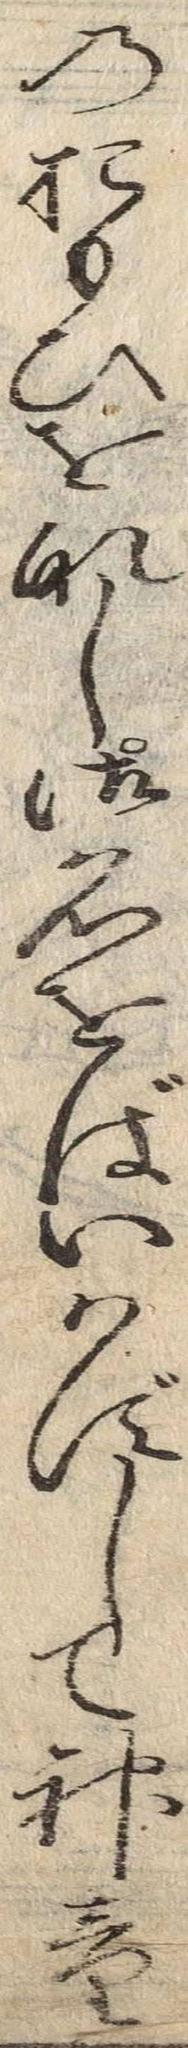のおもひをなし御名をばいはずして神童
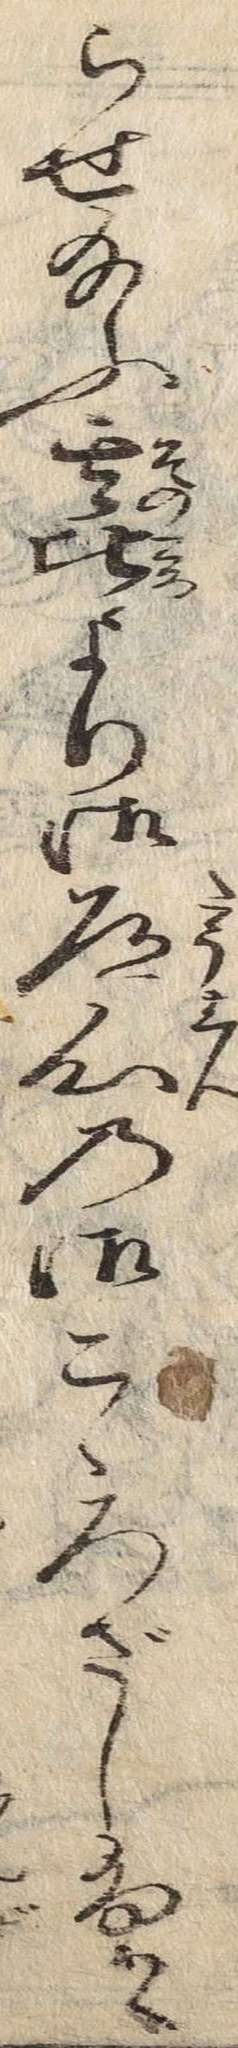らせ給ふ其頃より御道心の御こゝろざしふかゝ
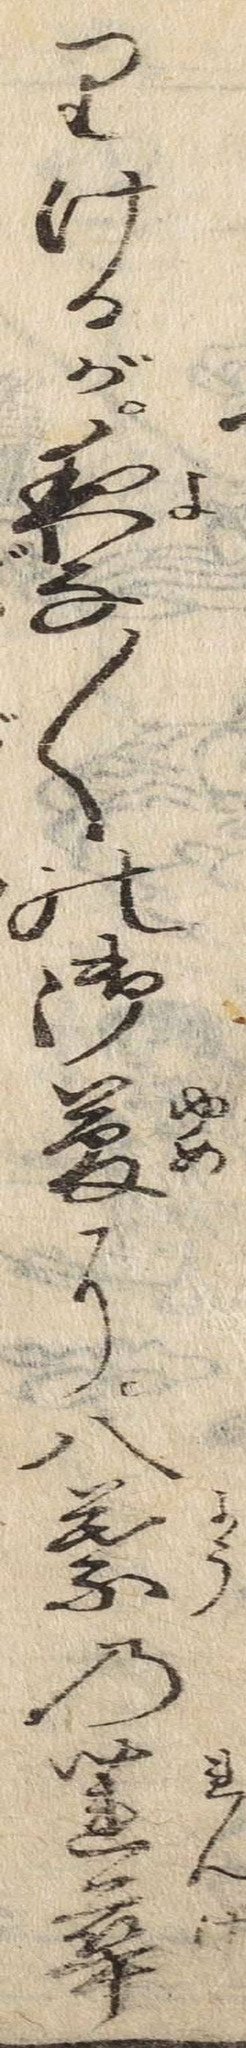りけるが夜な〳〵の御夢に。八葉の蓮華
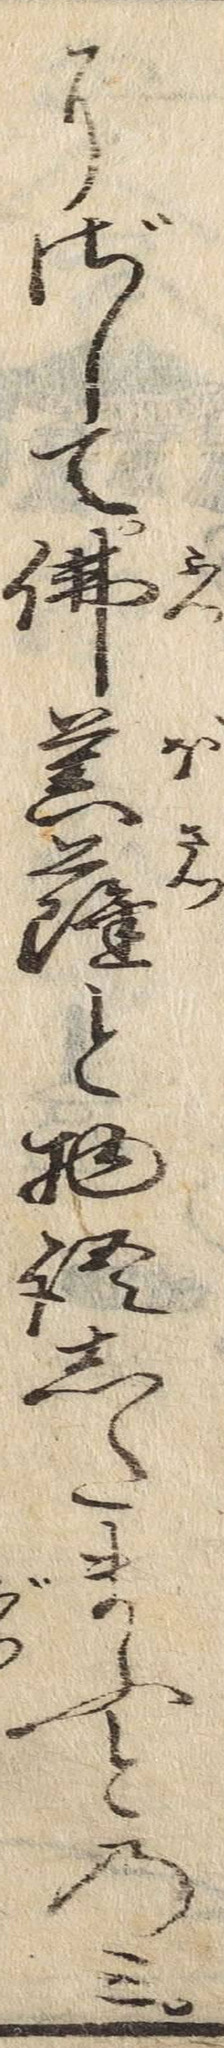にざして仏菩薩と物語したまふとのみ。
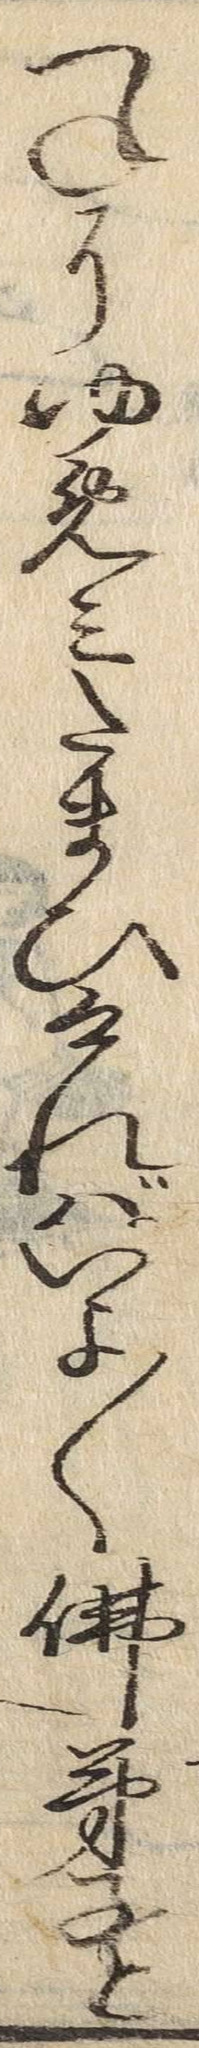つねにゆめみたまひければいよ〳〵仏弟子と
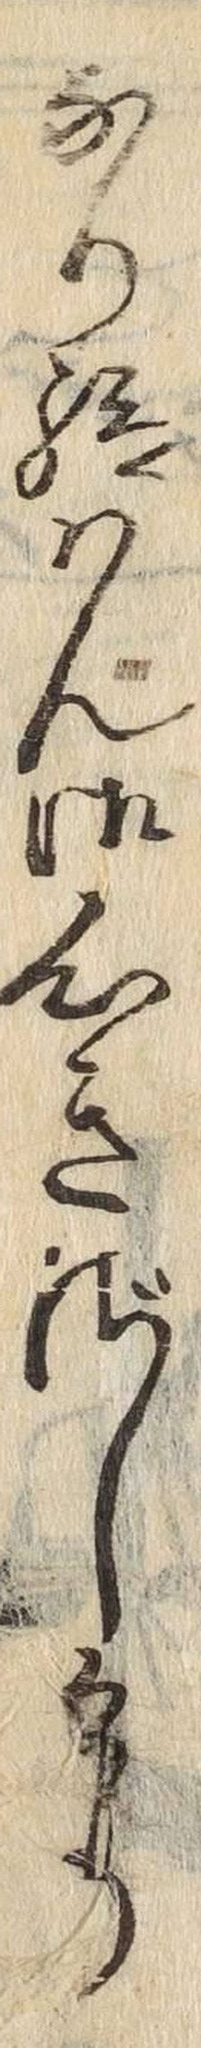なり給はん御心きざしけり

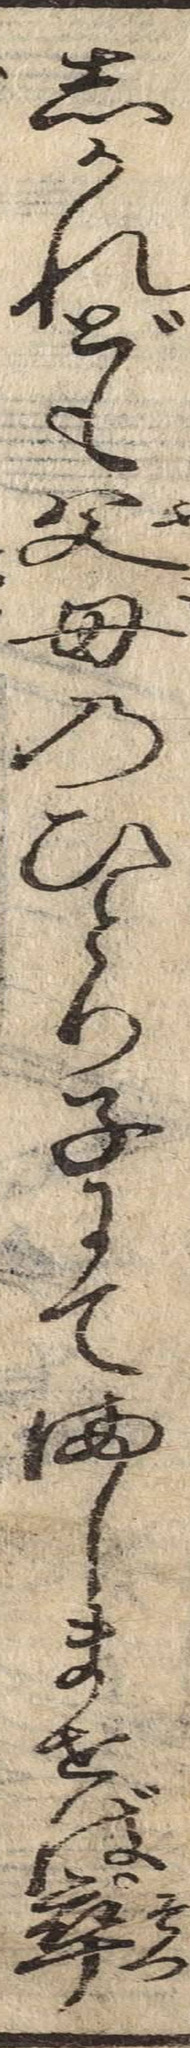しかれども父母のひとり子にてましませば。卒
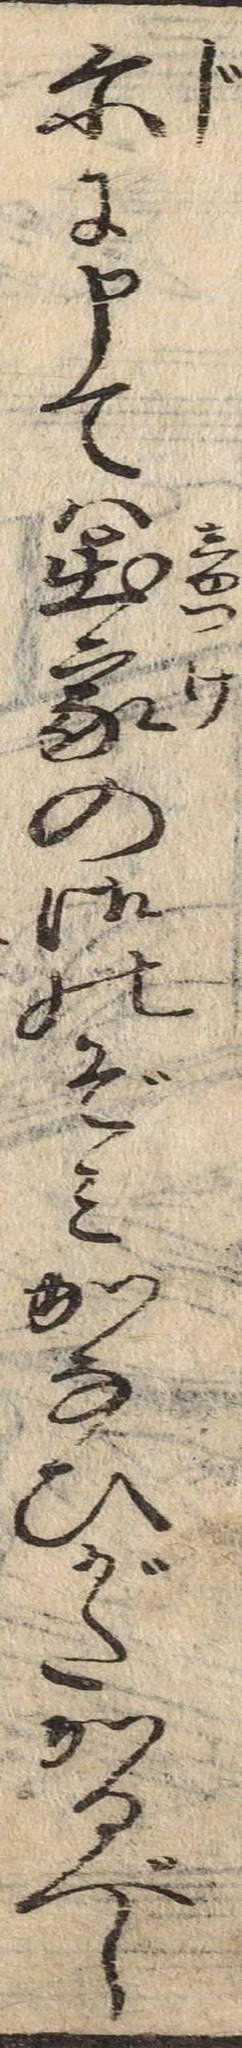尓に申ては出家の御のぞみかなひがたかるべし
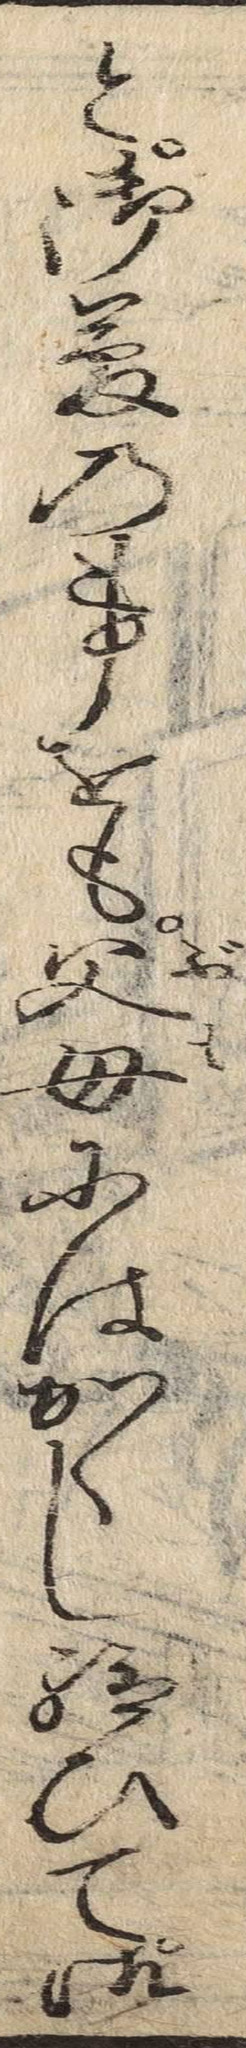と。御夢の事をも。父母にはかくし給ひて御
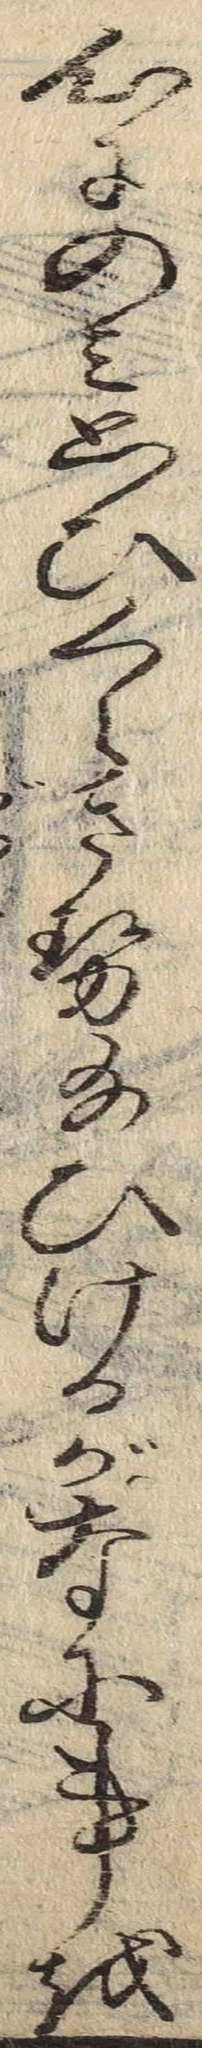心のみ思ひくらさせ給ひけるが。なに事を
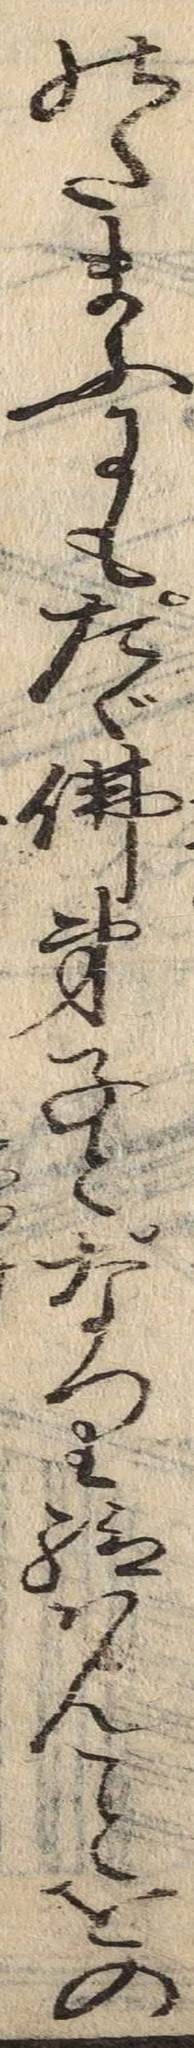のたまふにも。たゞ仏弟子と。なり給はんことをの
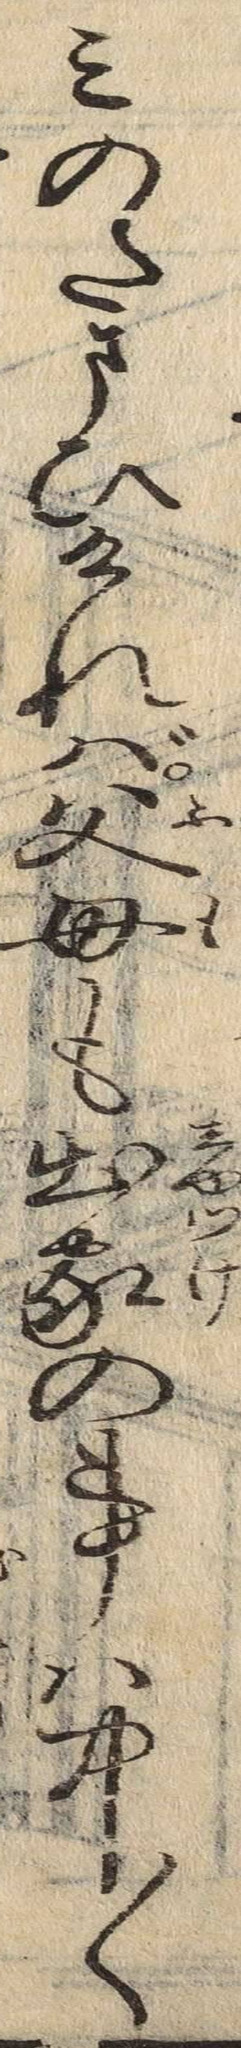みのたまひければ。父母も出家の事は中〳〵
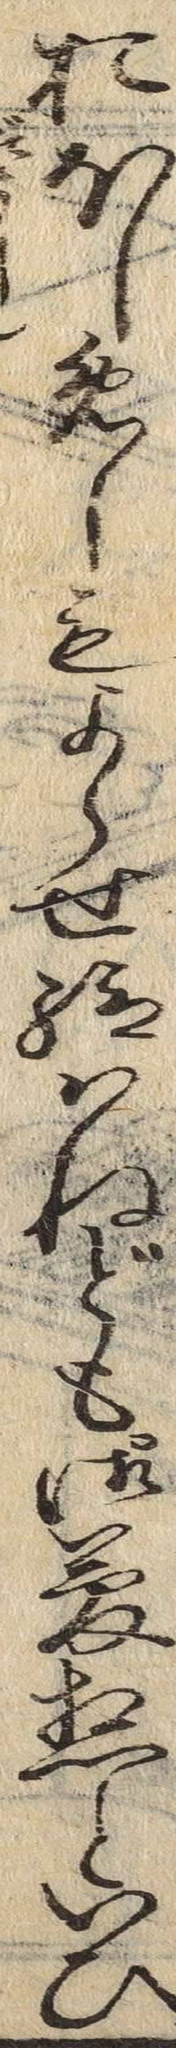おぼしめしもよらせ給はねども御夢想といひ。
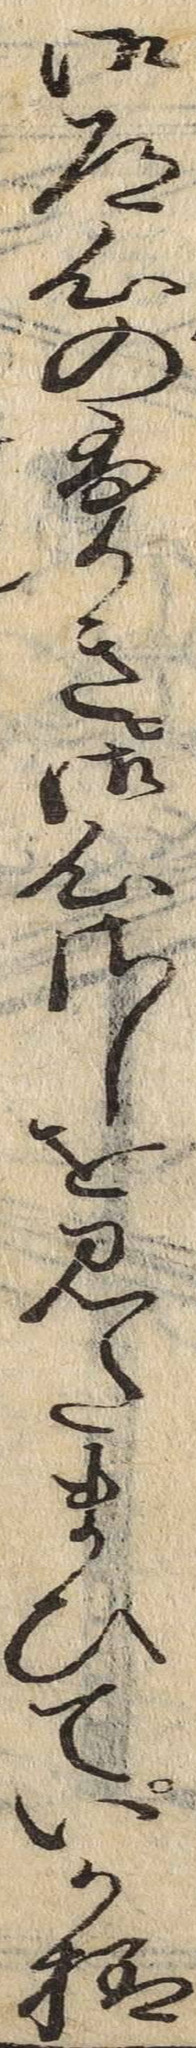御道心のふかき。御心さしを見たまひて。いか様
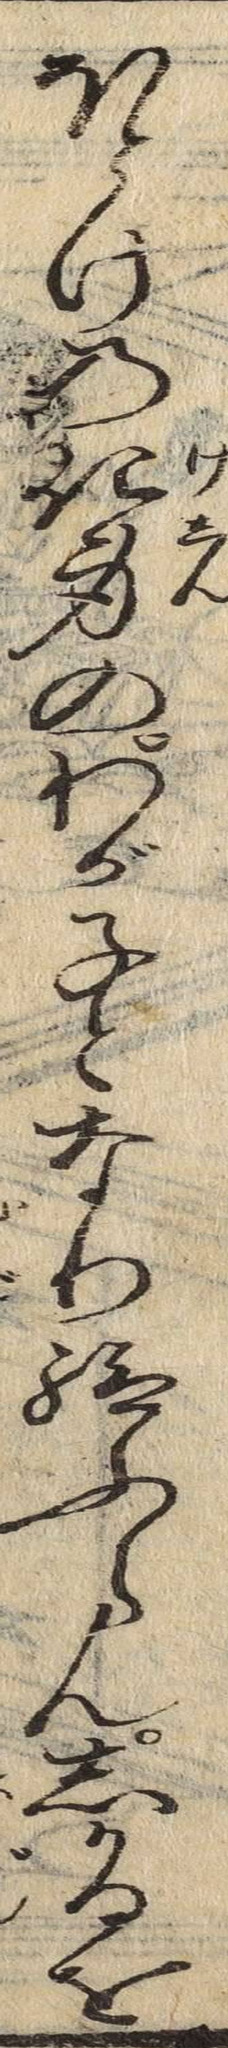ほとけの化身の。わが子となり給ふらん。しかるを
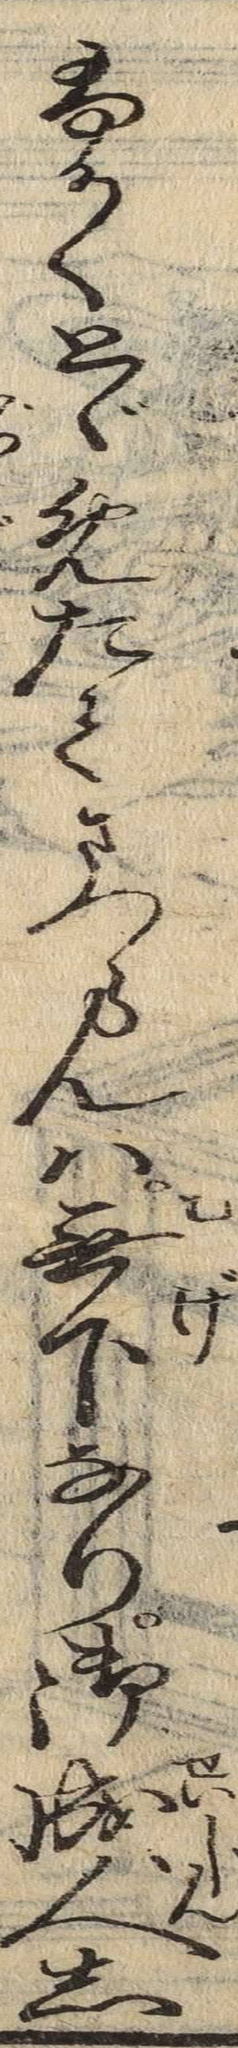ふかくとゞめたてまつらんは。無下なり。御成人し
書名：弘法大師御傳記
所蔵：京都府立京都学・歴彩館 国文学研究資料館
